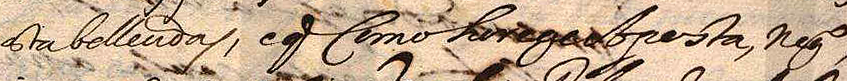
estabellecidas, e q̄ Como herege Aposta, nego
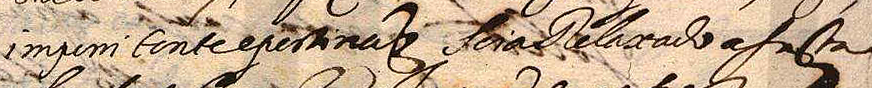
impenitente e pertinaz seia Relaxado a Justa
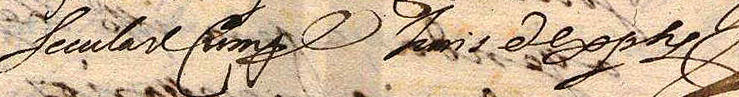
Secular Cumꝓe Iuris et expsis
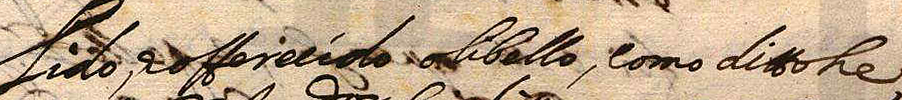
Lido, e offerecido o libello, como ditto he
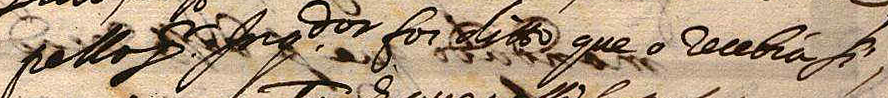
pello s.r Jnq.dor foi ditto que o recebia si,
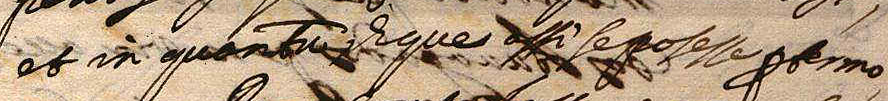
et in quantū, E que assi se posesse ꝑ termo
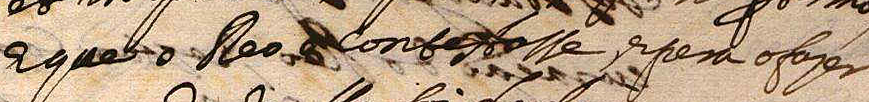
E que o Reo o contestasse, E pera o fazer
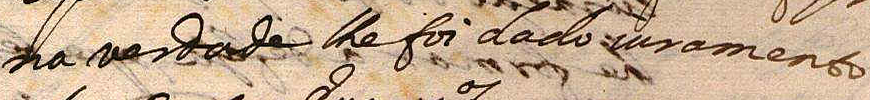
na verdade lhe foi dado iuramento
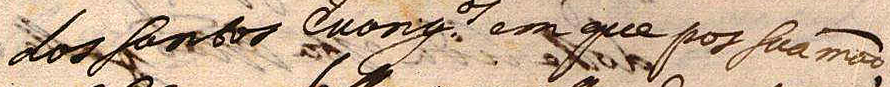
dos santos Euang.os em que pos sua mão
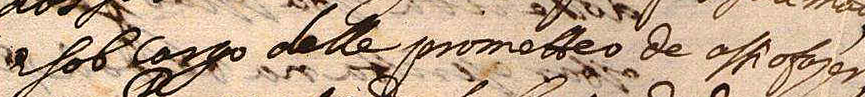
E sob cargo delle prometteo de assi o fazer
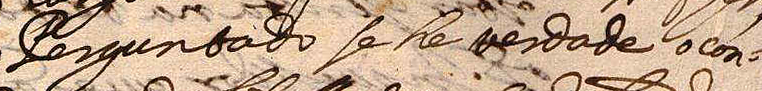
Perguntado se he verdade o con
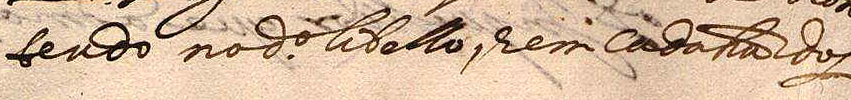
teudo no d.o libello, E em cada hū dos
